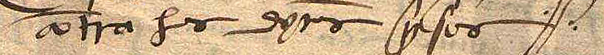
c̄otra hos dytos p̄sos .//.
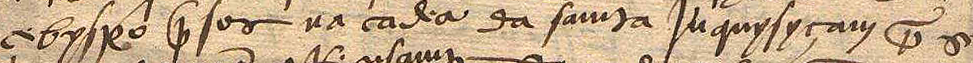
cebyspo p̄sos na cadea da samta Jnquysyçam p̄o se
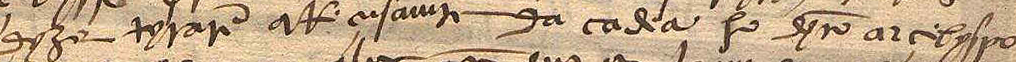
dyzer tyrarē a Recusamte da cadea ho dyto arcebyspo
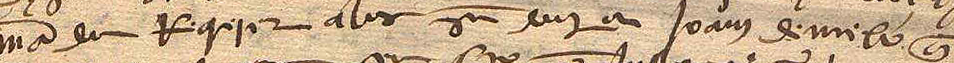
mādou Reqerer a vos s̄or doutor Joam de melo q̄
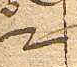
2
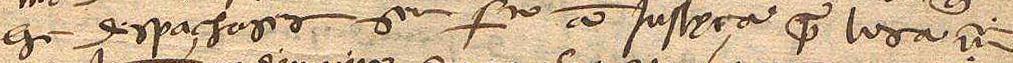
lhe despachases seu fto c̄o Justyça p̄o vosa m̄
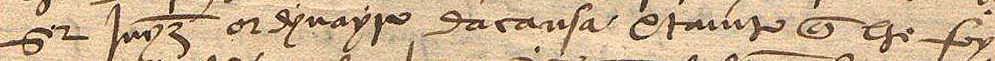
ser Juȳz ordynaryo da causa e tamto q̄ lhe foy
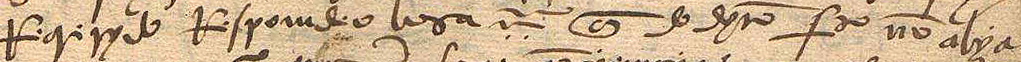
Reqerydo Respomdeo vosa m̄ q̄ do dyto fto n̄o avya
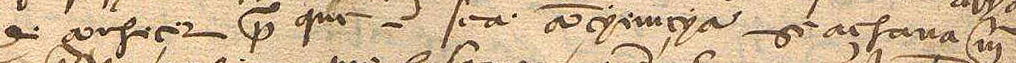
de conhecer p̄oque ē sua c̄ocyemcya se achaua mto
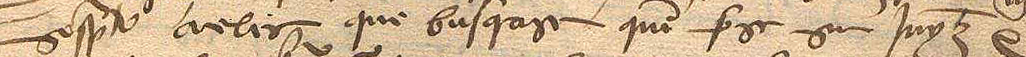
sospto a eles que busqase quē fose seu Juȳz e
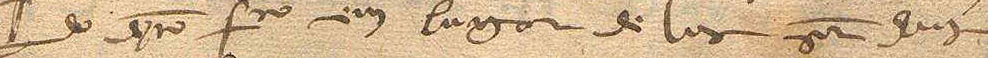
do dyto fto em lugar de vos s̄or doutor
